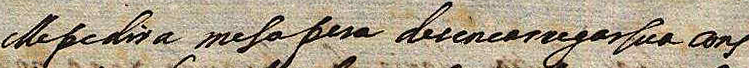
elle pedira mesa pera desencarregar sua cons
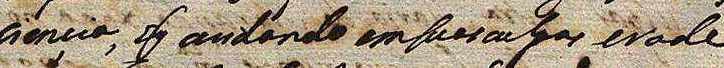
ciençia, E q̄ cuidando em suas culpas era de
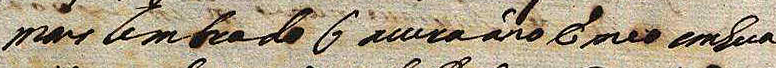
mais lembrado q̄ auera āno & meo em huā
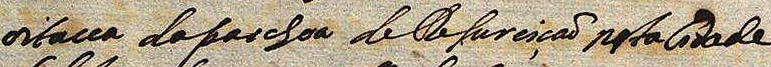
oitaua da paschoa de Resureiçaõ nesta Cidade
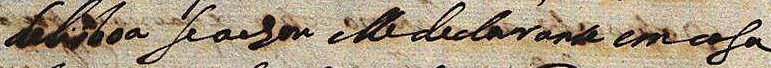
de lisboa se achou elle declarante em casa
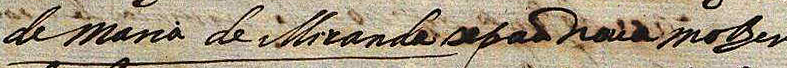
de maria de Miranda xpaã noua molher
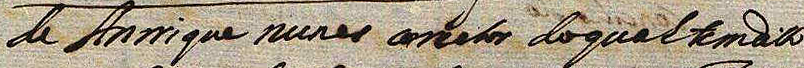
de Anrrique nunes corector do qual tem ditto
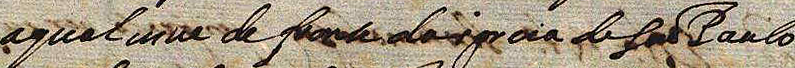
a qual uiue de fronte da igreja de saõ Paulo
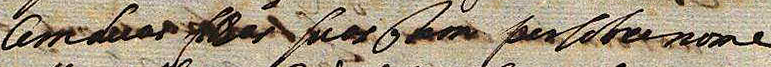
Com duas filhas suas q̄ tem por sobrenome
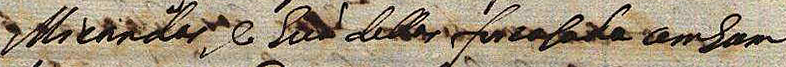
Mirandas e huā dellas foi casada com hum
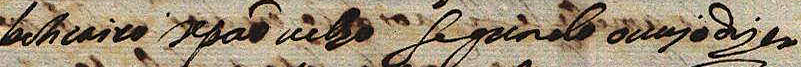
boticairo xpaõ uelho segundo ouuio dizer
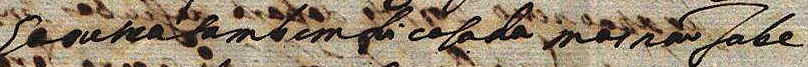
E a outra tambem foi casada mas naõ sabe
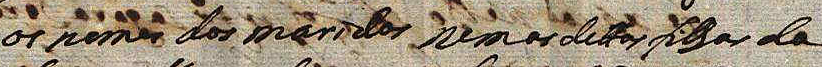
os nomes dos maridos nem as dittas filhas da
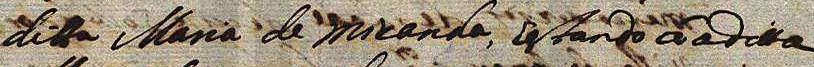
ditta Maria de miranda, E estando cō a ditta
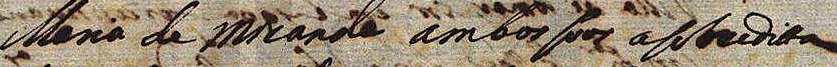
Maria de miranda ambos soos a sobreditta
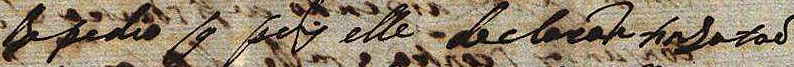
lhe pedio q̄ porq̄ elle declarāte tinha taõ
